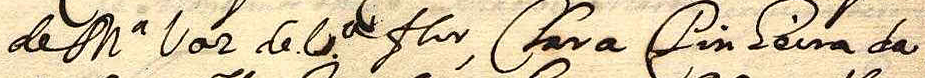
de M.a Vaz de U.a flor, Clara Pinheira da
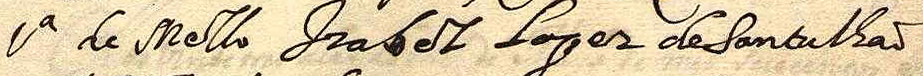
V.a de Mello Izabel Lopez de Santulhaõ
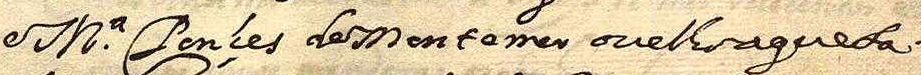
e M.a Ponces de Montemor o uelho a que sa
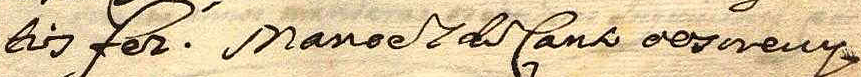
tisfez. Manoel do Canto o escreuy.
